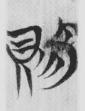賜
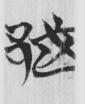{戉阝}
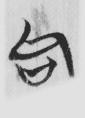句
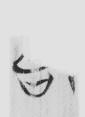句
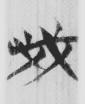{戈戈}
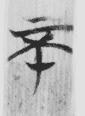不
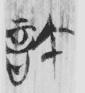許
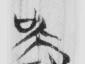吳
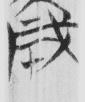成
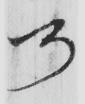乃
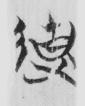𫹒
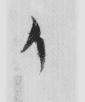人
